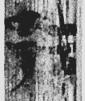邦
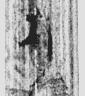人
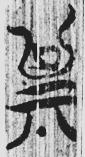其
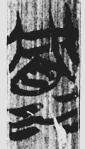○（沮）
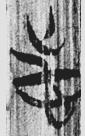志
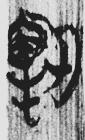解
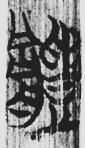體
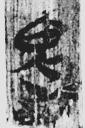胃
